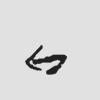㠯（以）
